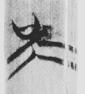吳
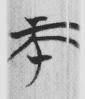帀
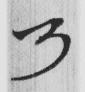乃
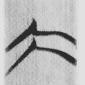大
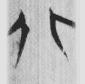北
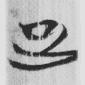疋
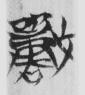戰
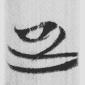疋
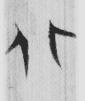北
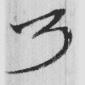乃
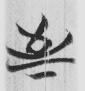至
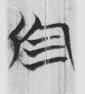於
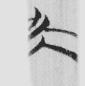吳
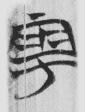𩁹
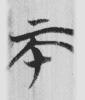帀
